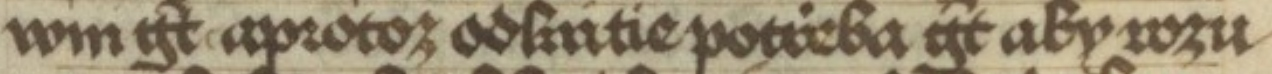wni g̑t aprotoz odkritie potṙeba g̑t aby rozu-
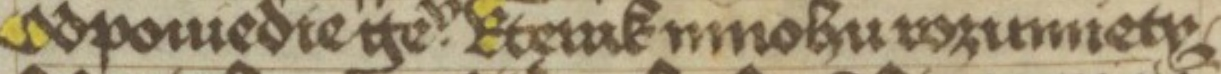Odpouiedie ge.v Kterak mnohu rozumiety
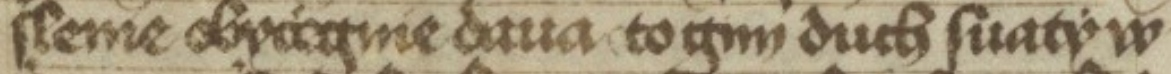ẛlenie obyċegnie daua, to gim duch ſuaty w-
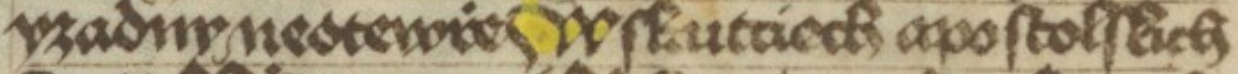yzadny neotewṙe W ſkutciech apoſtolſkich
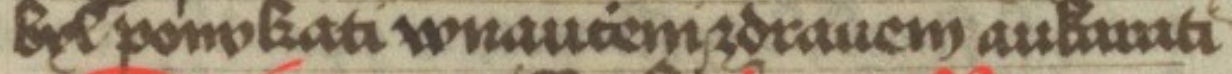byl ponvkati wnauċeni zdrauem aukarati
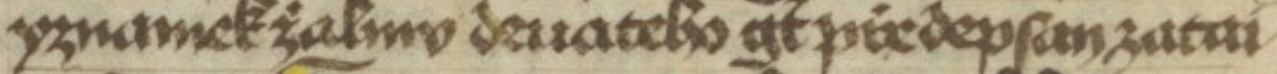yznamek żalmy deuateho g̑t pṙedepſan zatai-
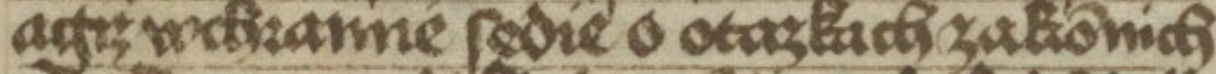agiż wchramie ſedie o otazkach zakônich
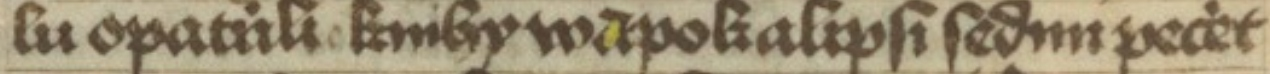lu opatṙili knihy wApokalipſi ſedmi peċet-
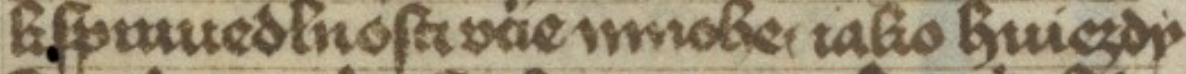kſprauedlnoſti vċie mnohe iako huiezdẏ
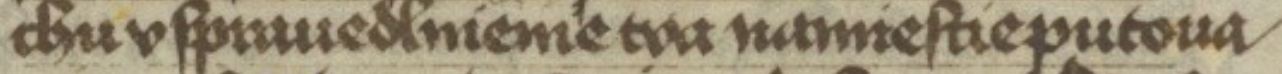chu v ſprauedlnienie tva namieſtie putoua-
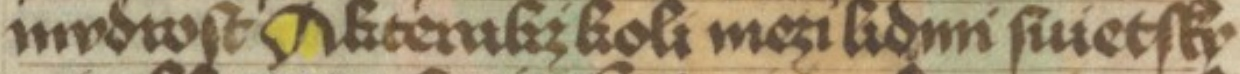mvdroſt A kterakż koli mezi lidmi ſuietſky
